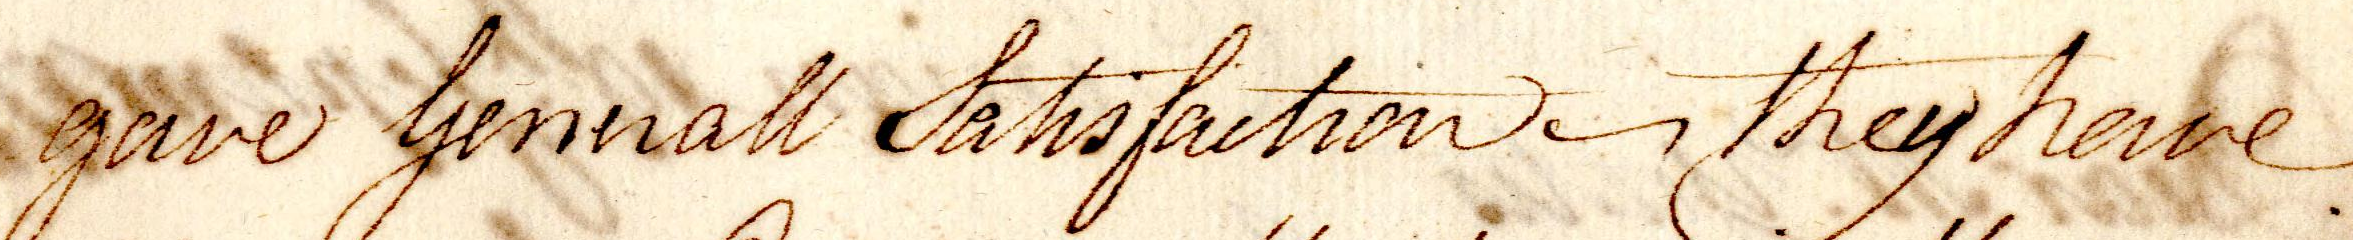gave Generall Satisfaction. they have
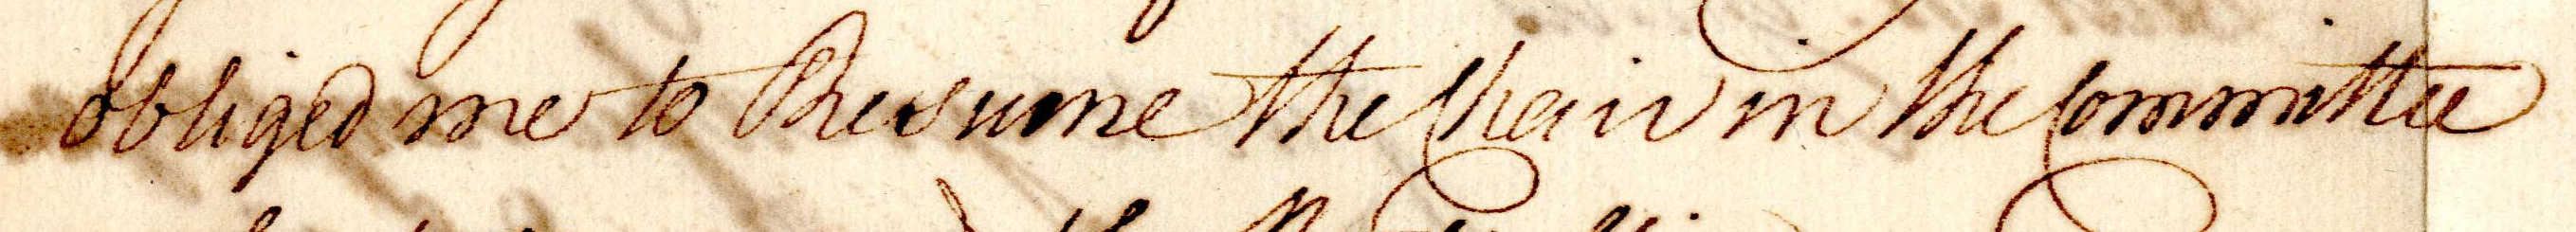Obliged me to Resume the Chair in the Committee
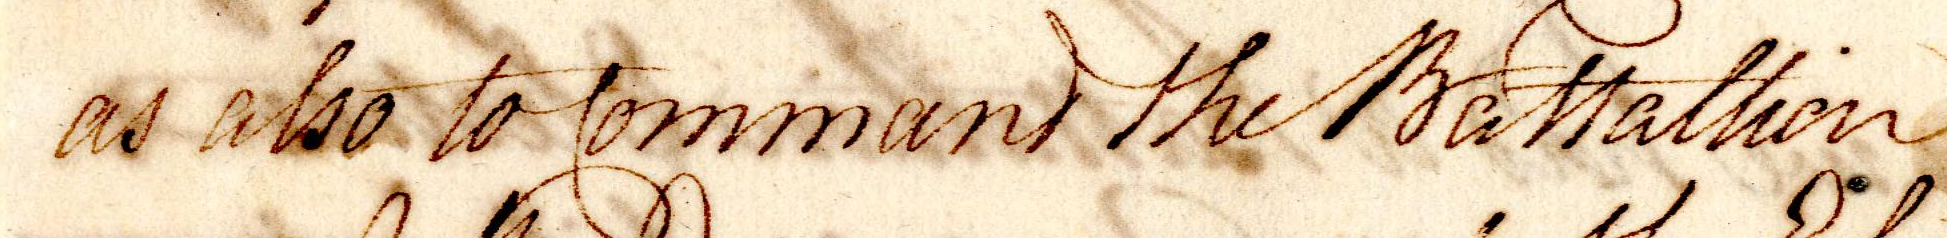as also to Command the Battallion
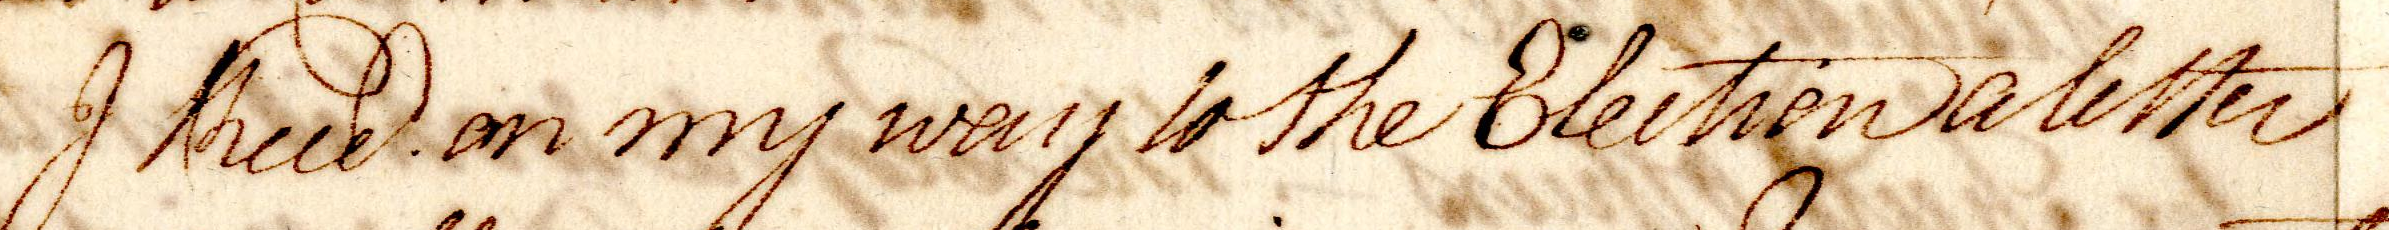I Reced. on my way to the Election a letter
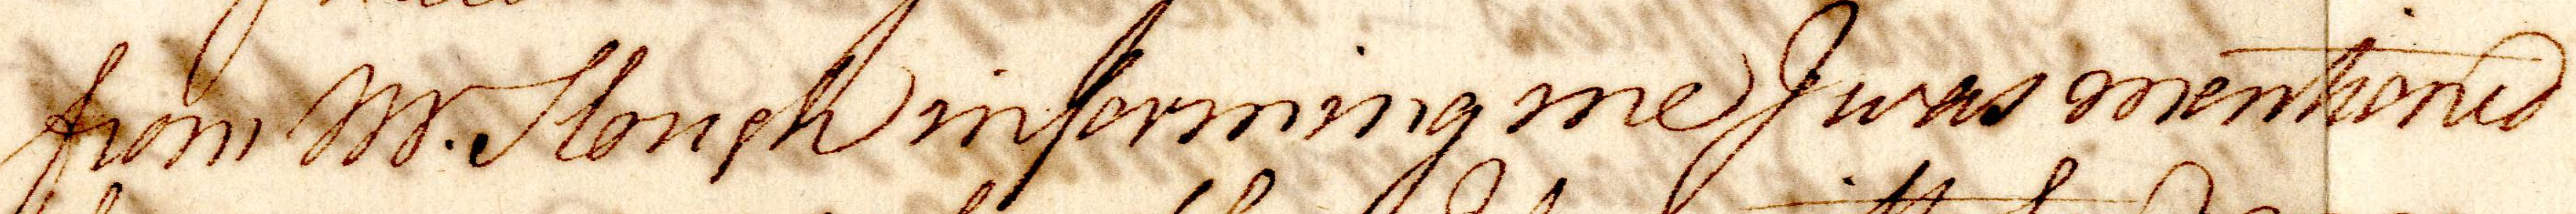from W. Slough informing me I was mentioned
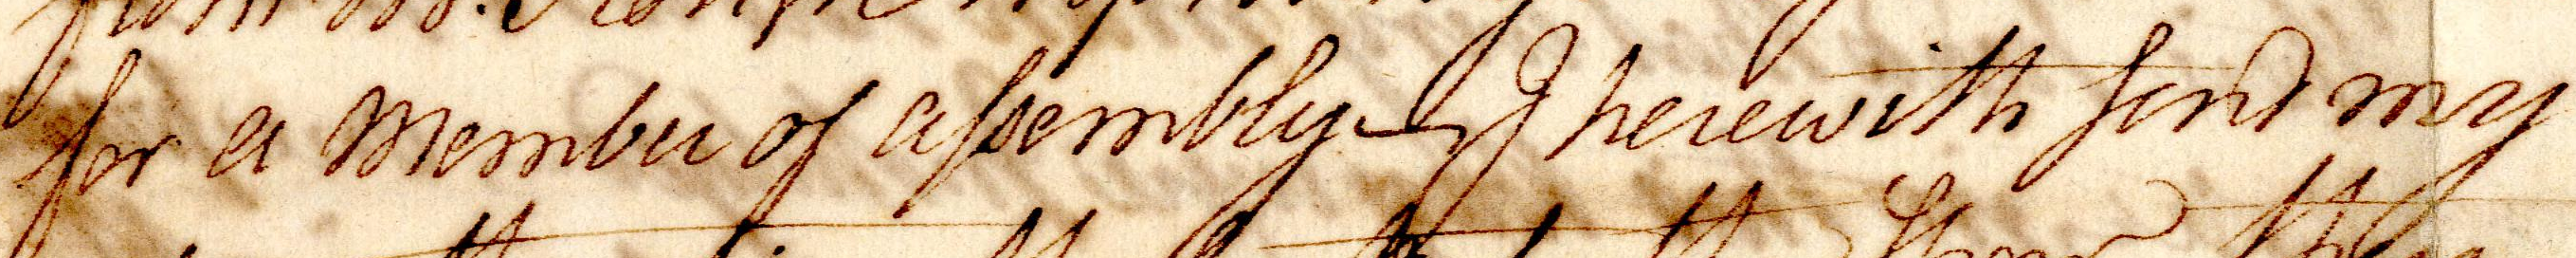for a Member of assembly. I herewith send my
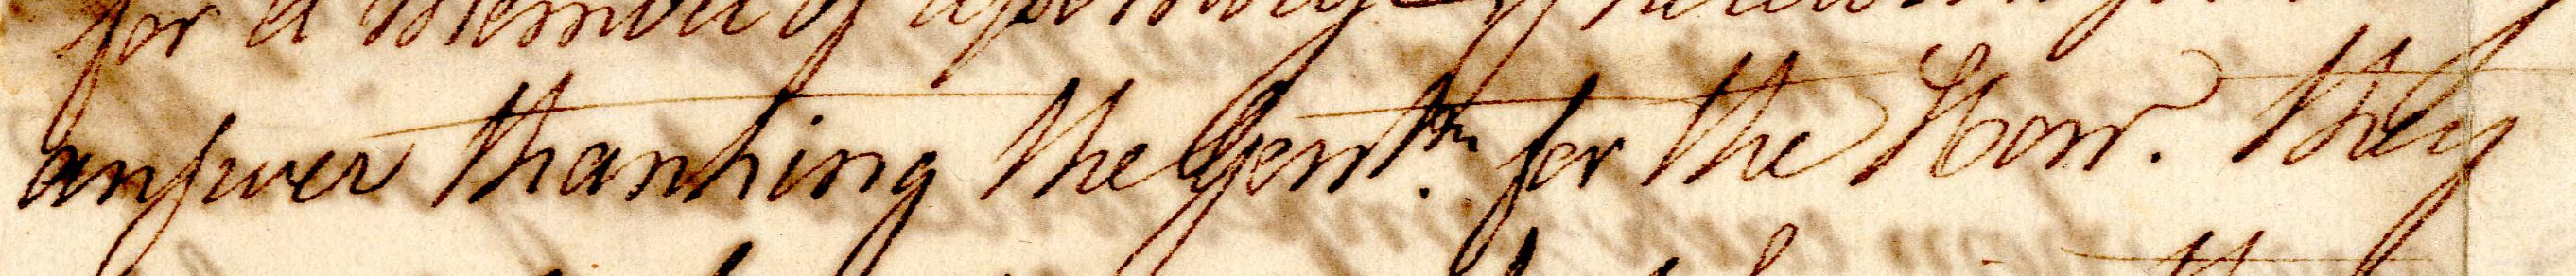answer thanking the Gent^n. for the Honr. they
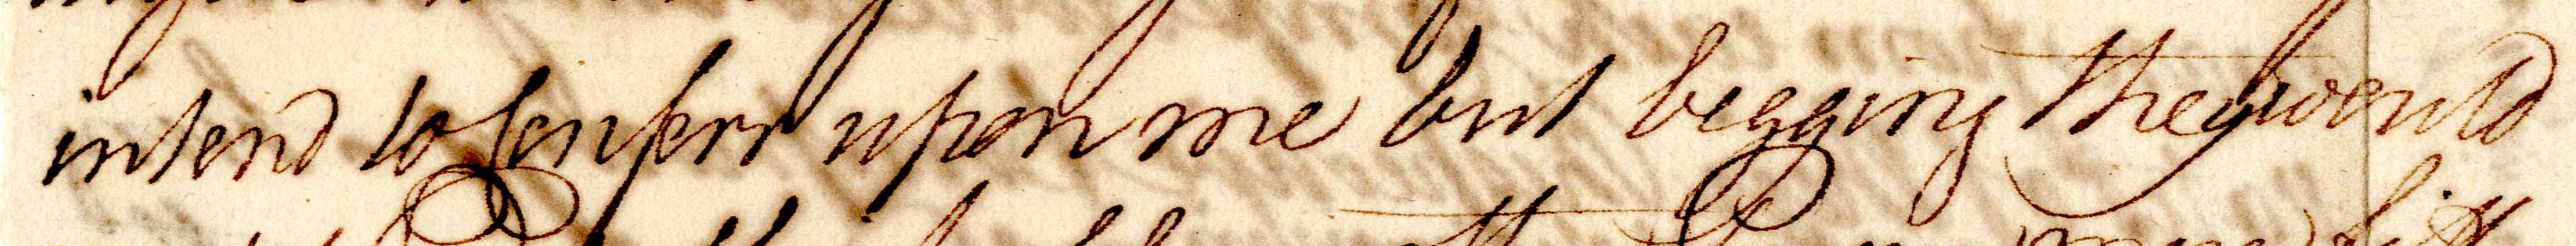intend to Conferr upon me but begging they would
